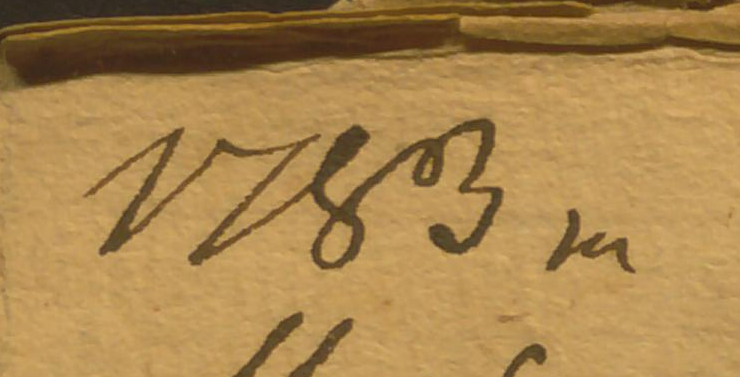1783
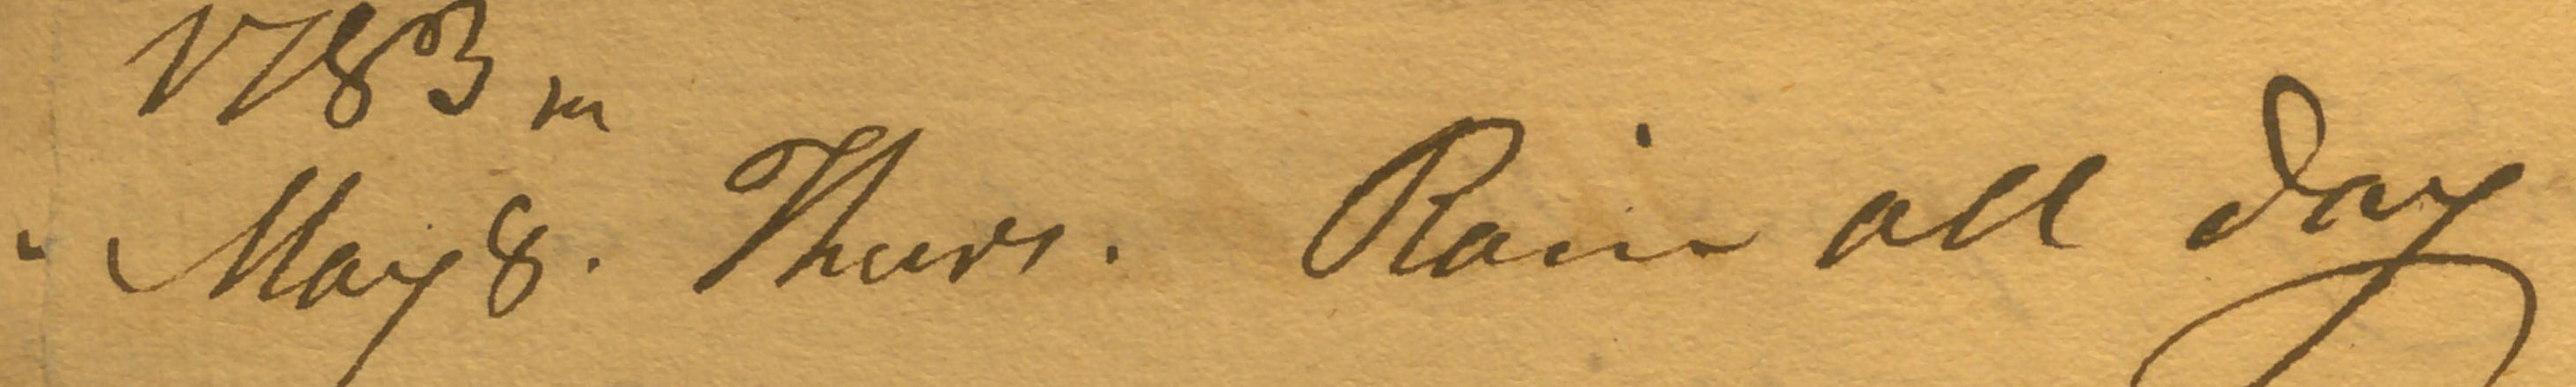May 8th. Thurs. Rain all day
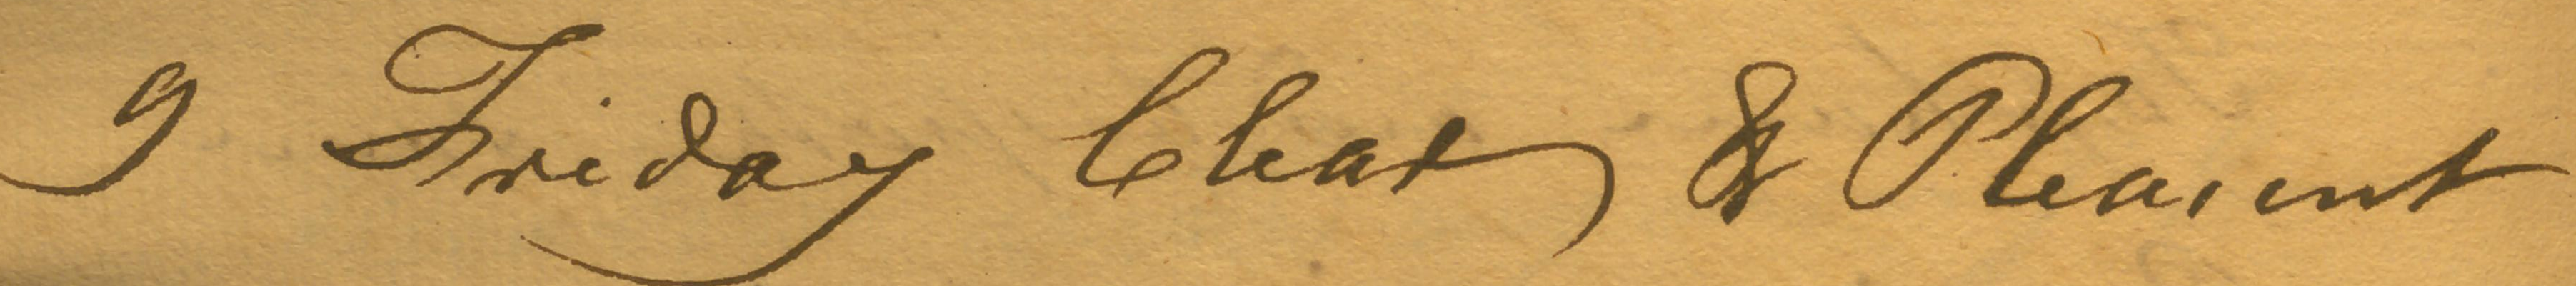9 Friday Clear & Pleasent
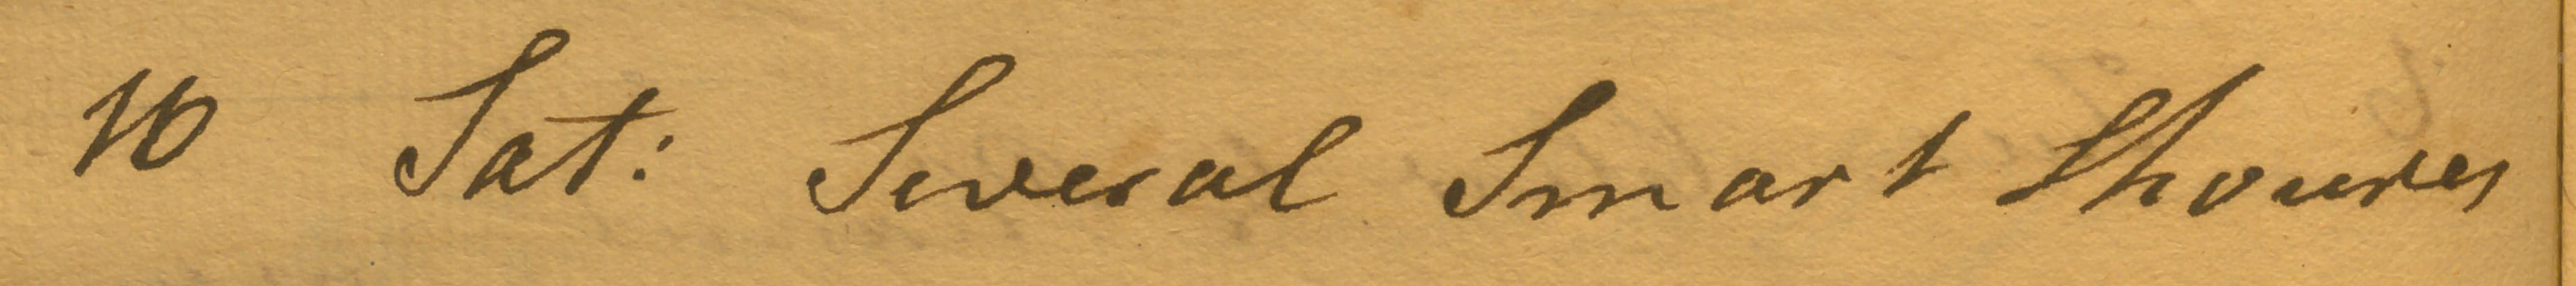10 Sat: Several Smart shoures
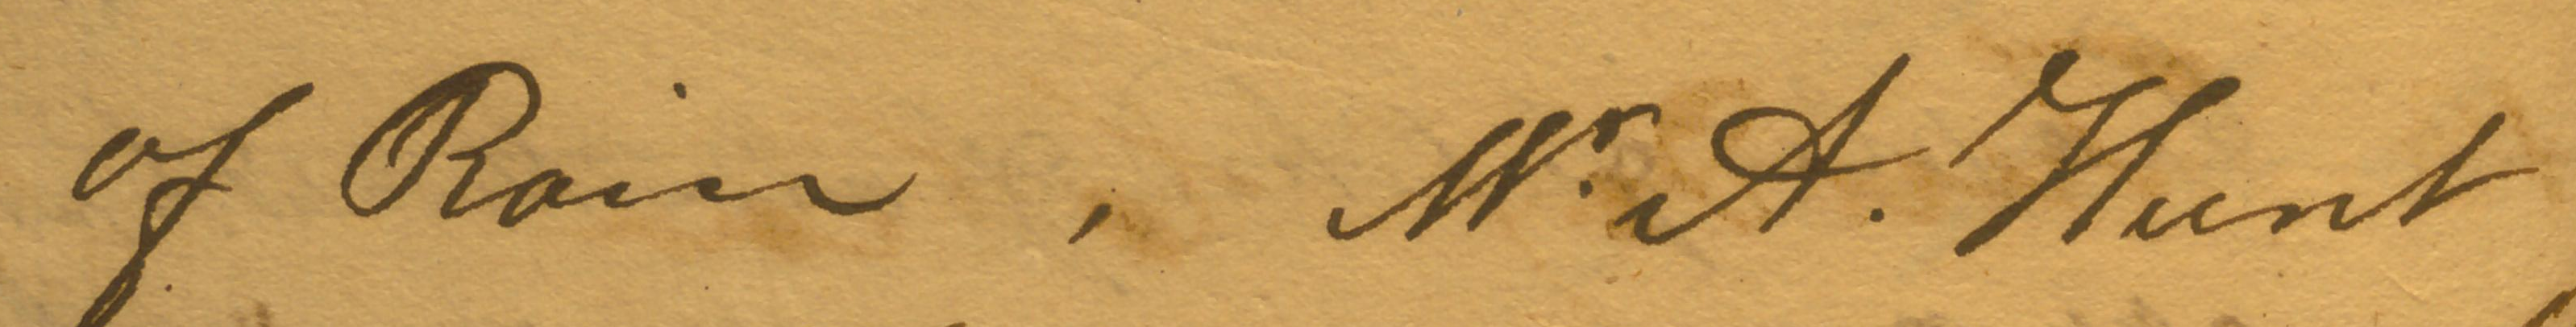of Rain, M^r. A. Hunt
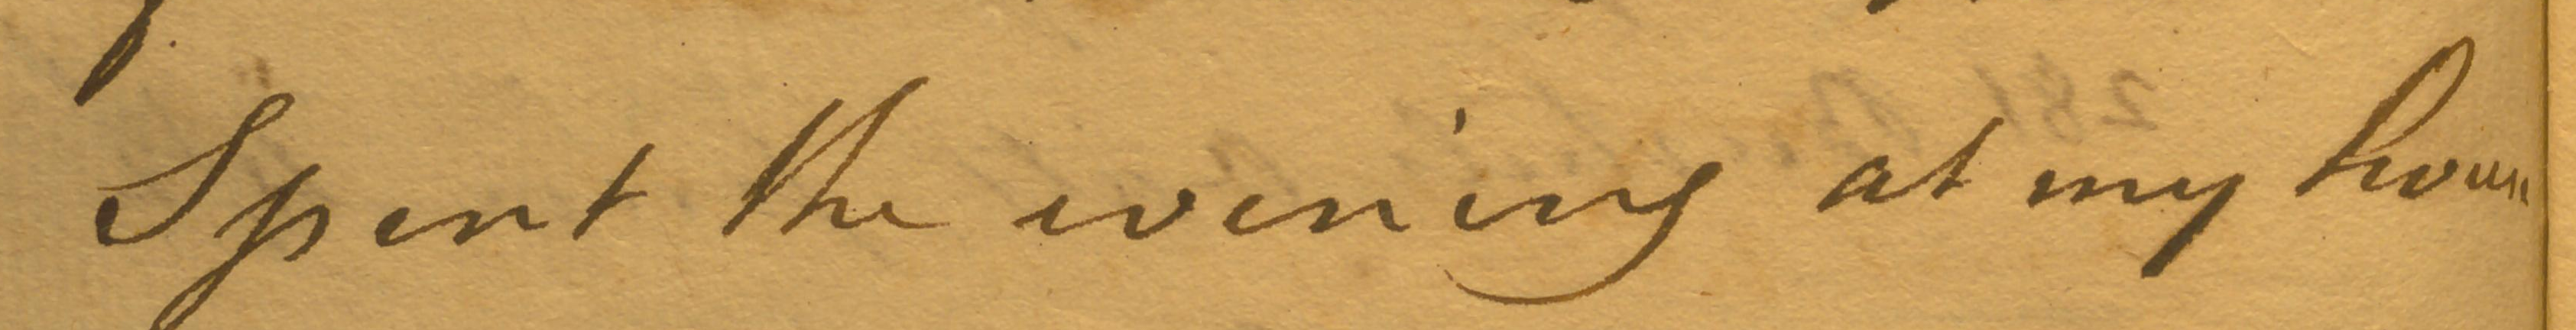spent the evening at my house
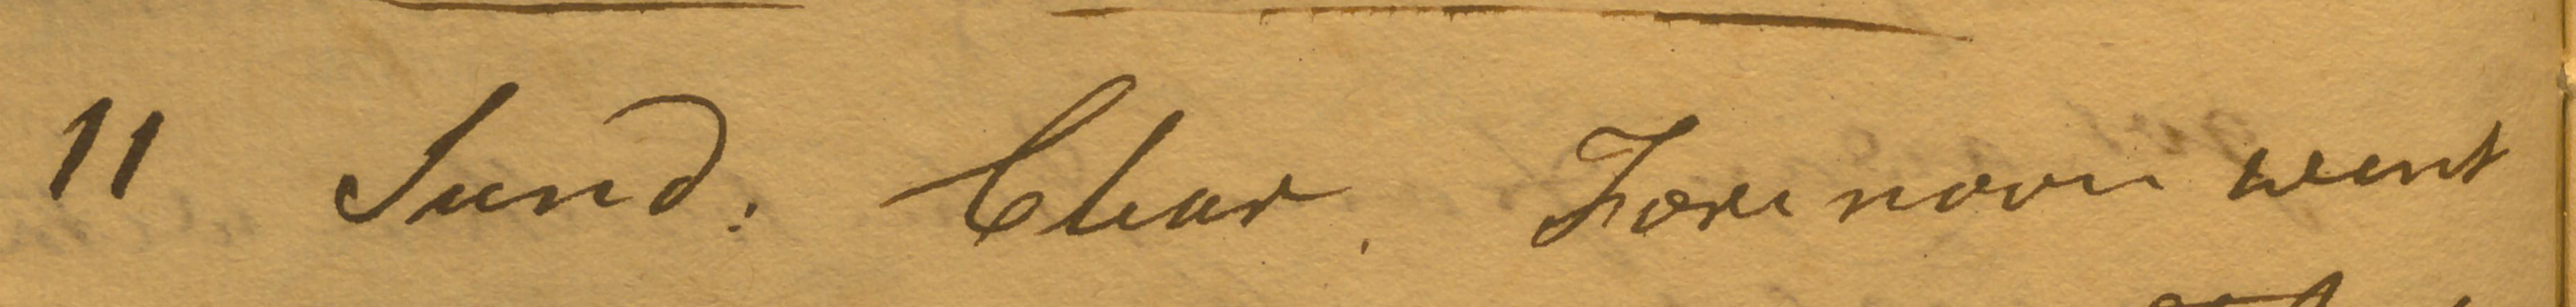11 Sund. Clear Forenoon went
